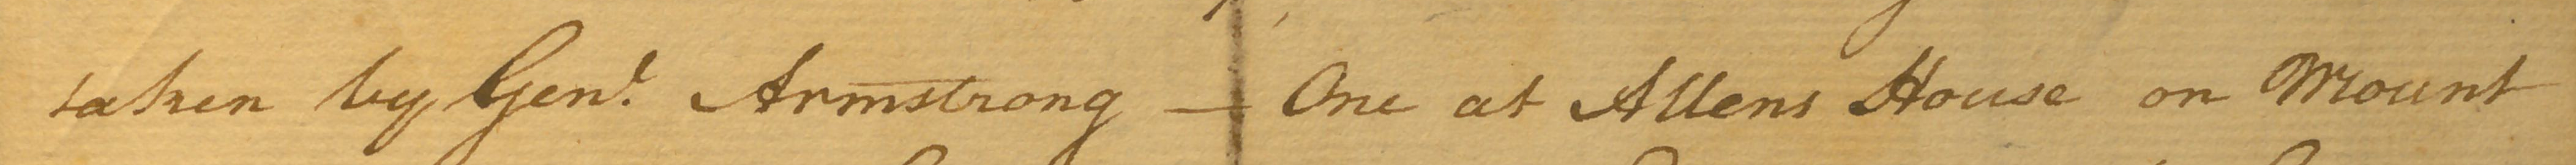when by Gen^l. Armstrong- One at Allens House on Mount
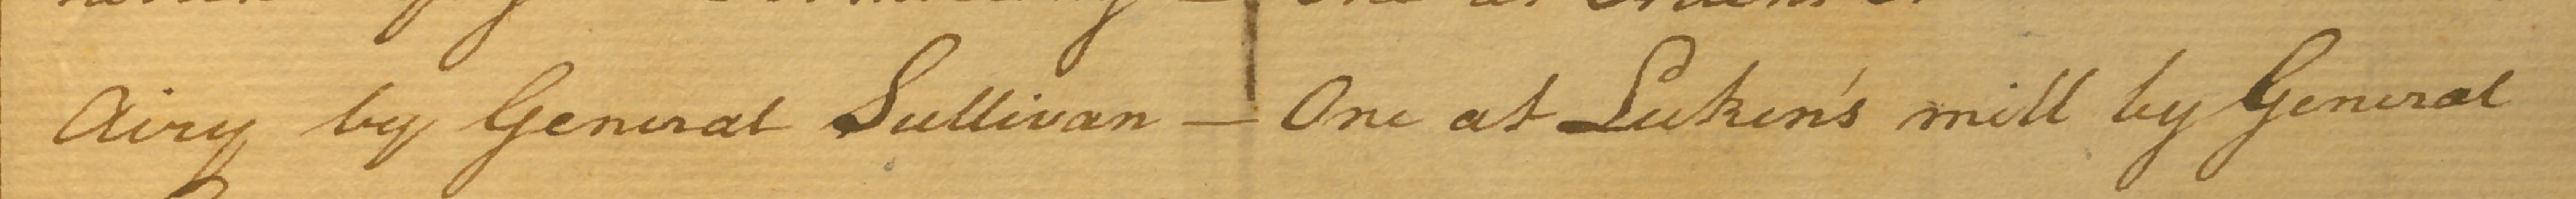Airy by General Sullivan- One at Luken's mill by General
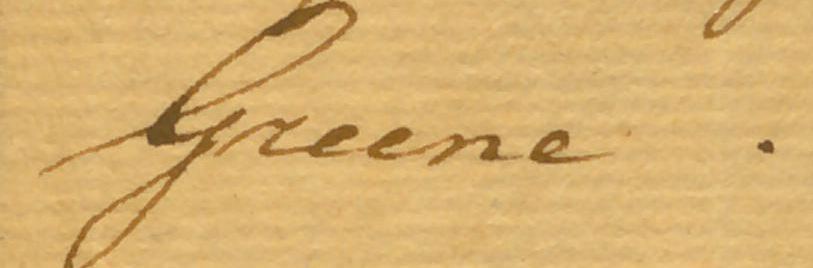Greene.
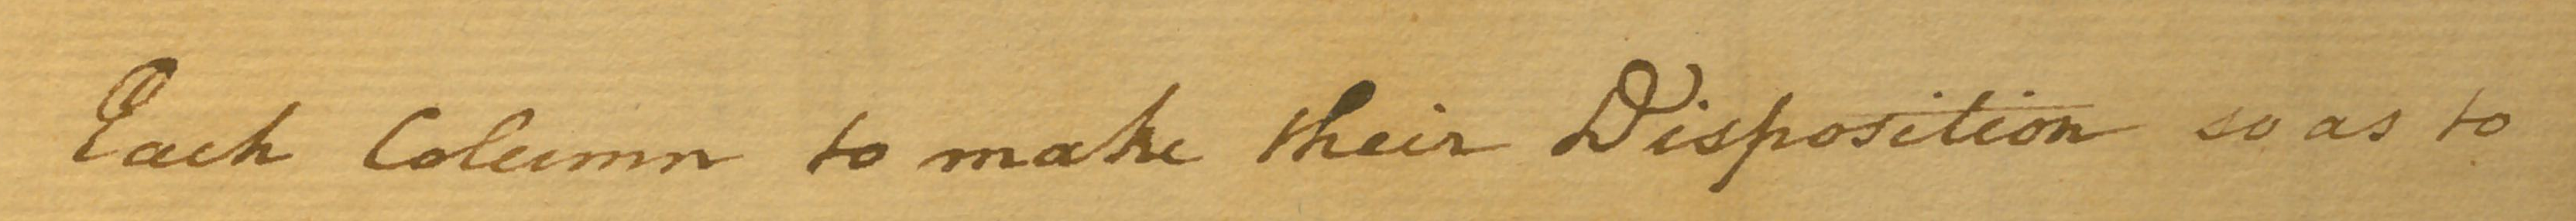Each Column to make their Disposition so as to
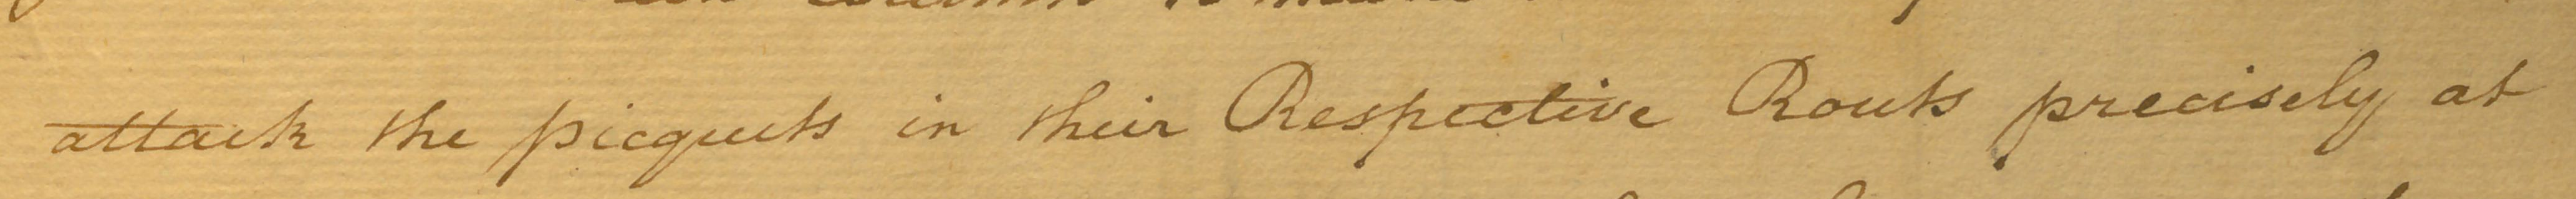attack the picquets in their Respective Routs precisely at
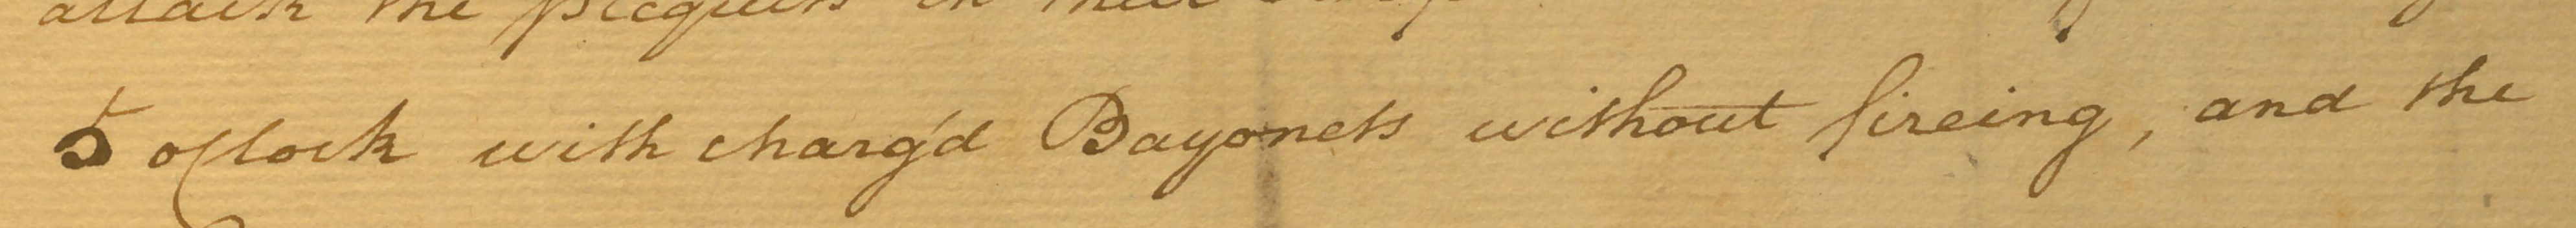5 oClock with charg'd Bayonets without fireing, and the
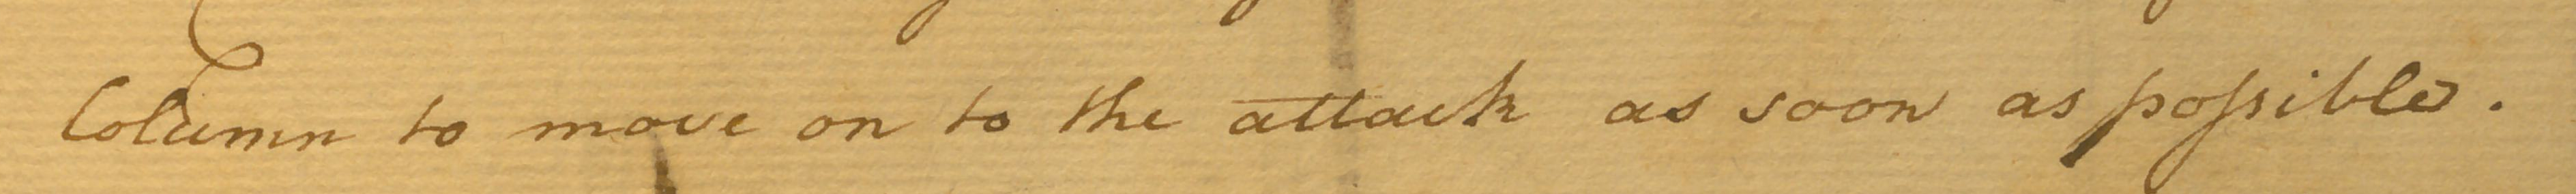Column to move on to the attack as soon as possible.
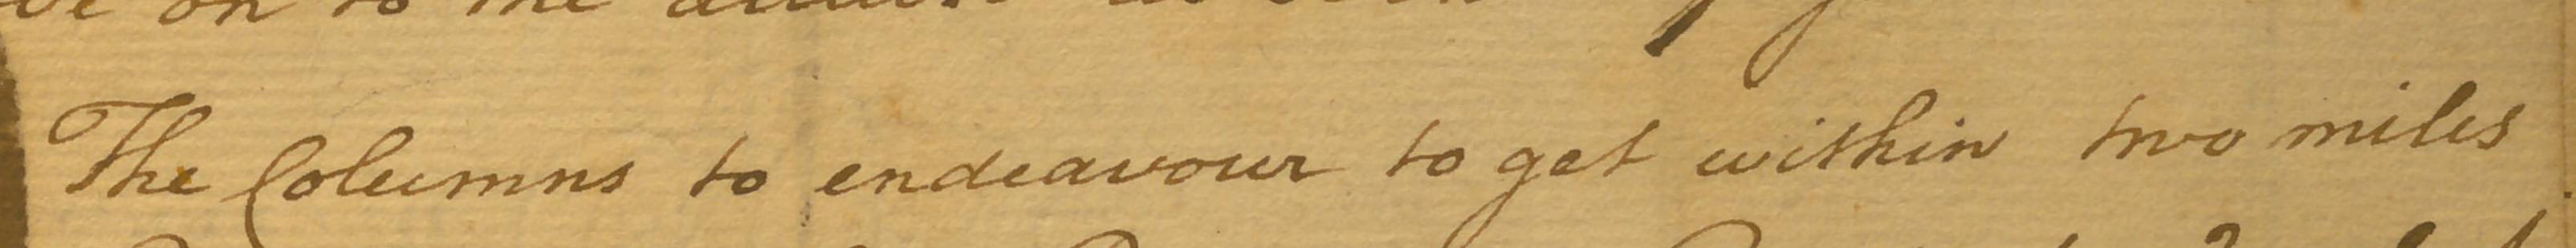The Columns to endeavour to get within two miles
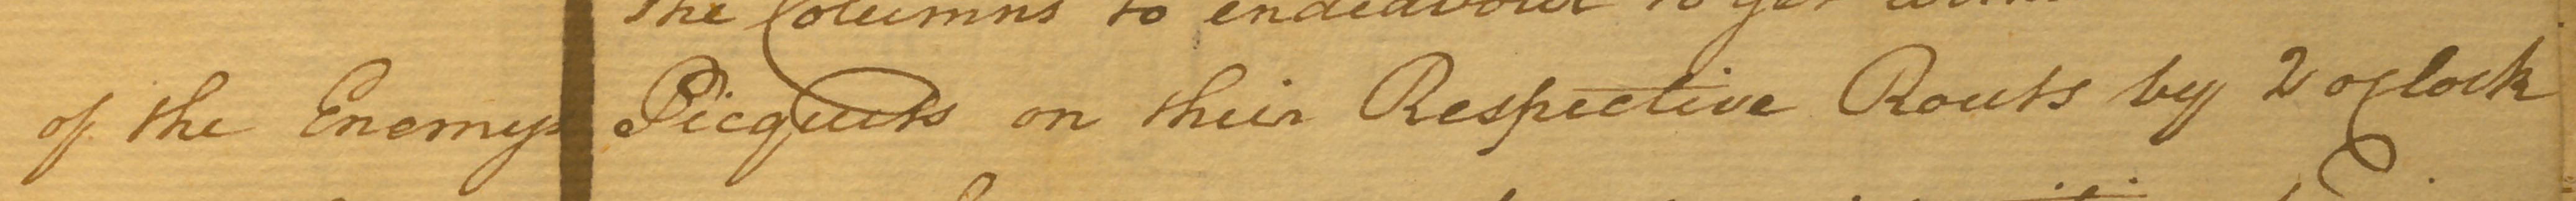of the Enemys Picquets on their Respective Routs by 2 oClock
